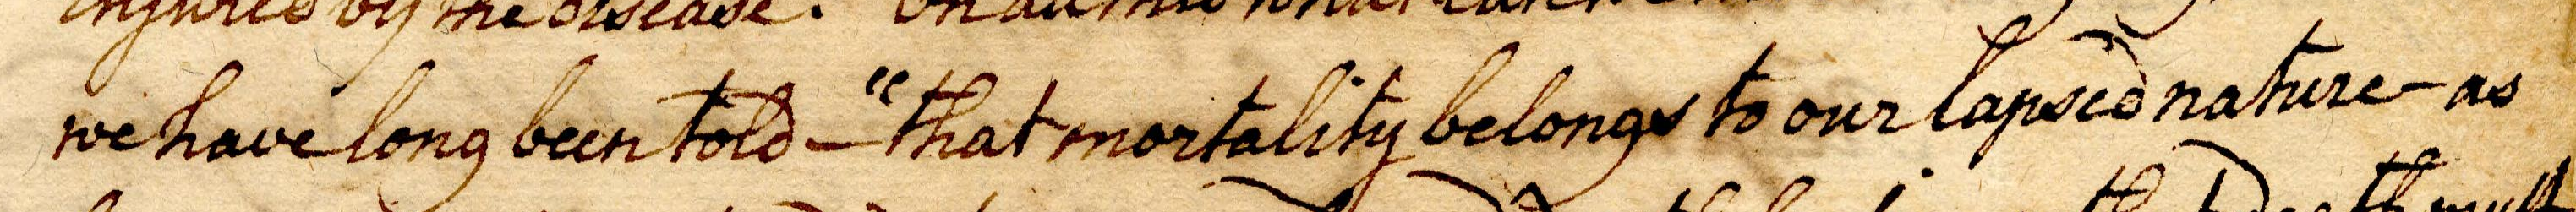we have long been told- "That mortality belongs to our lapsed nature-as
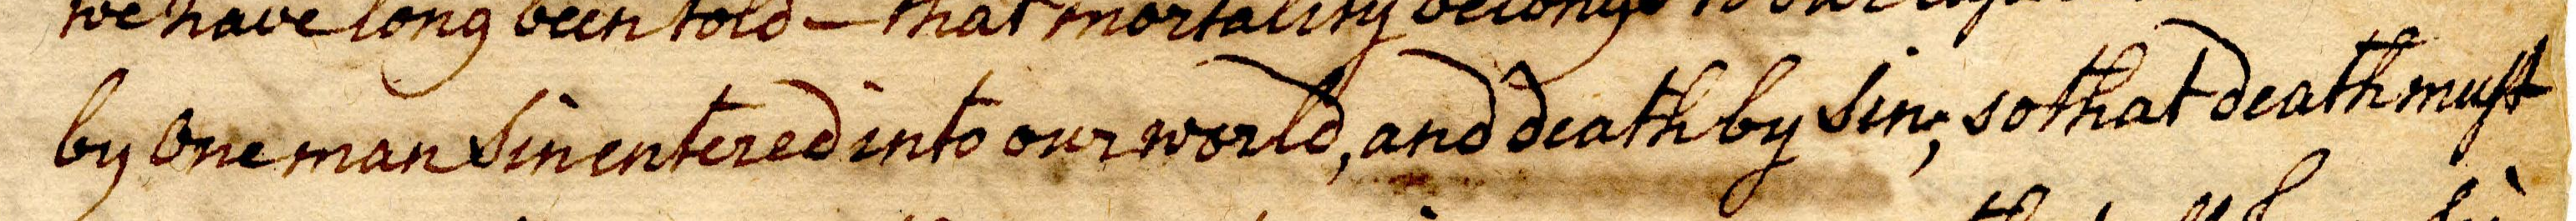by One man sin entered into our world, and death by sin, so that death must
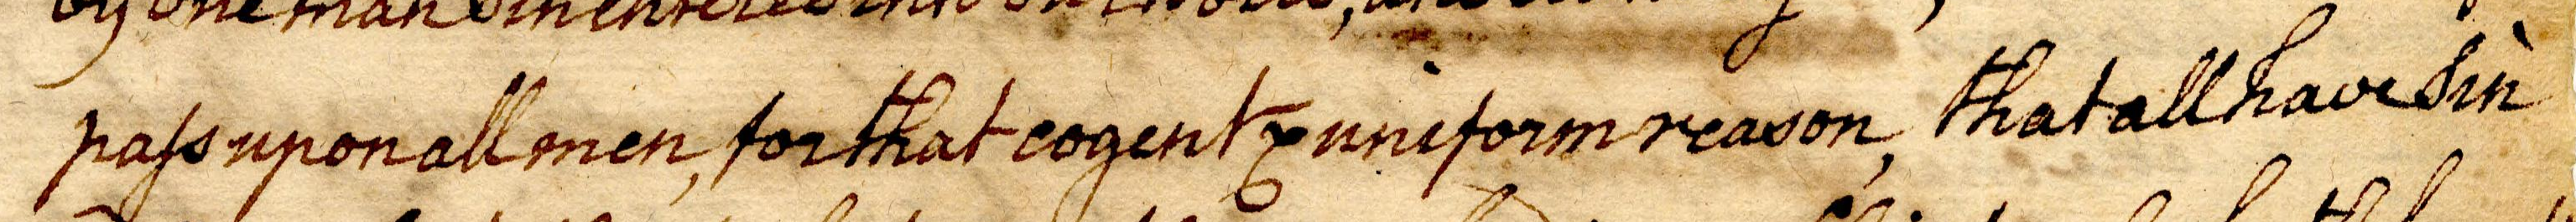pass upon all men, for that cogent & uniform reason that all have sin
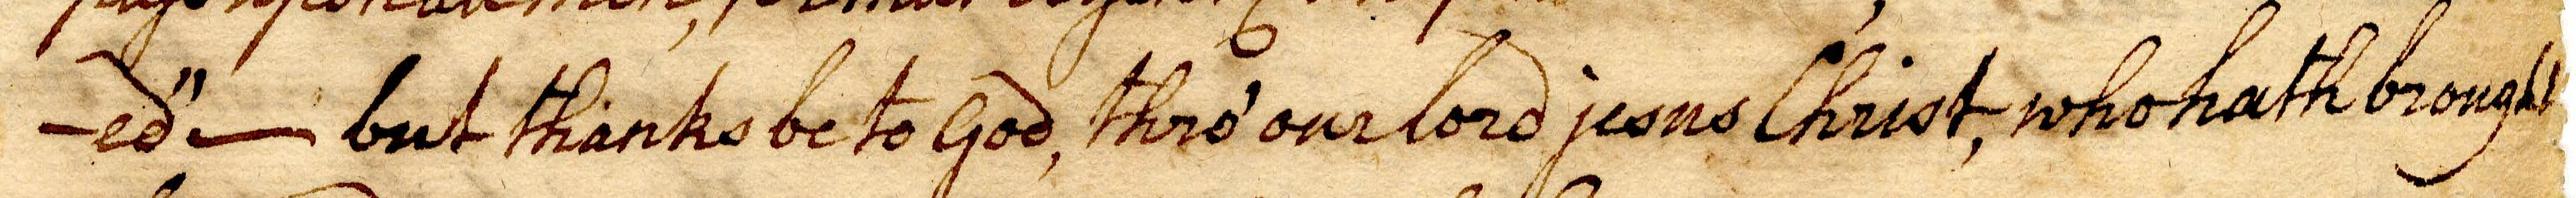-ed"- but thanks be to God, thro' our lord jesus Christ, who hath brought
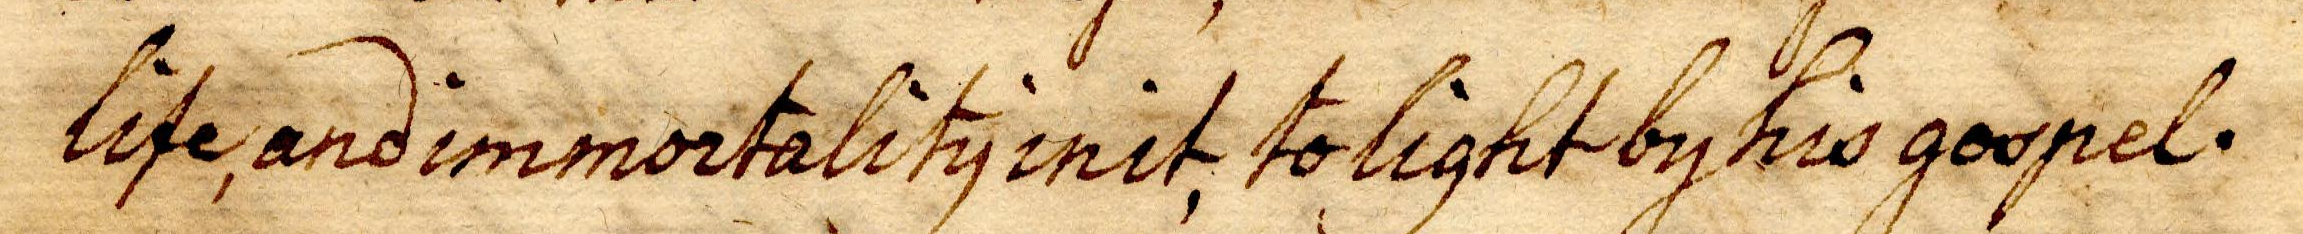life, and immortality in it, to light by his gospel.
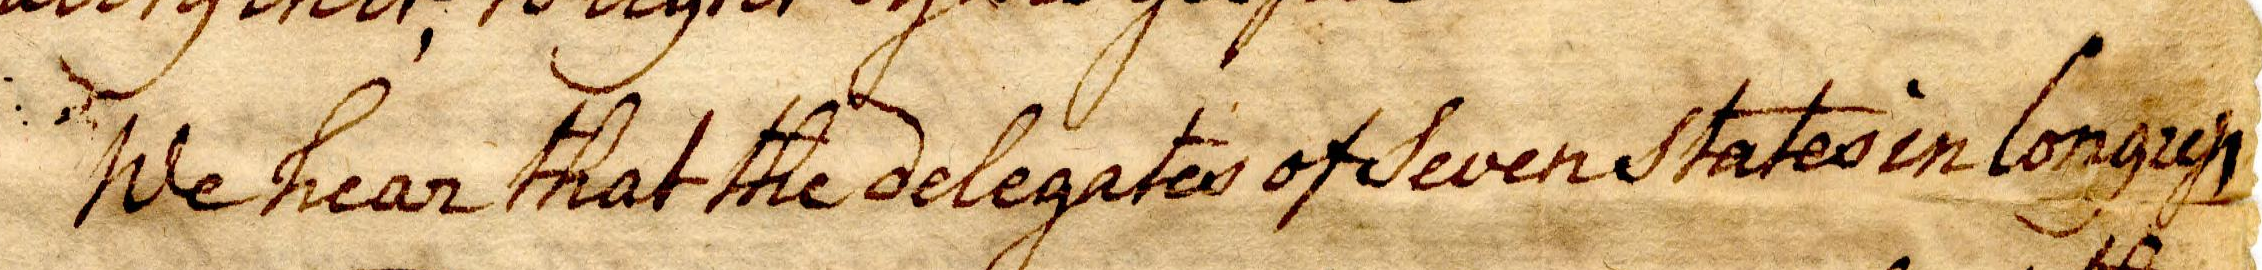We hear that the delegates of seven states in Congress
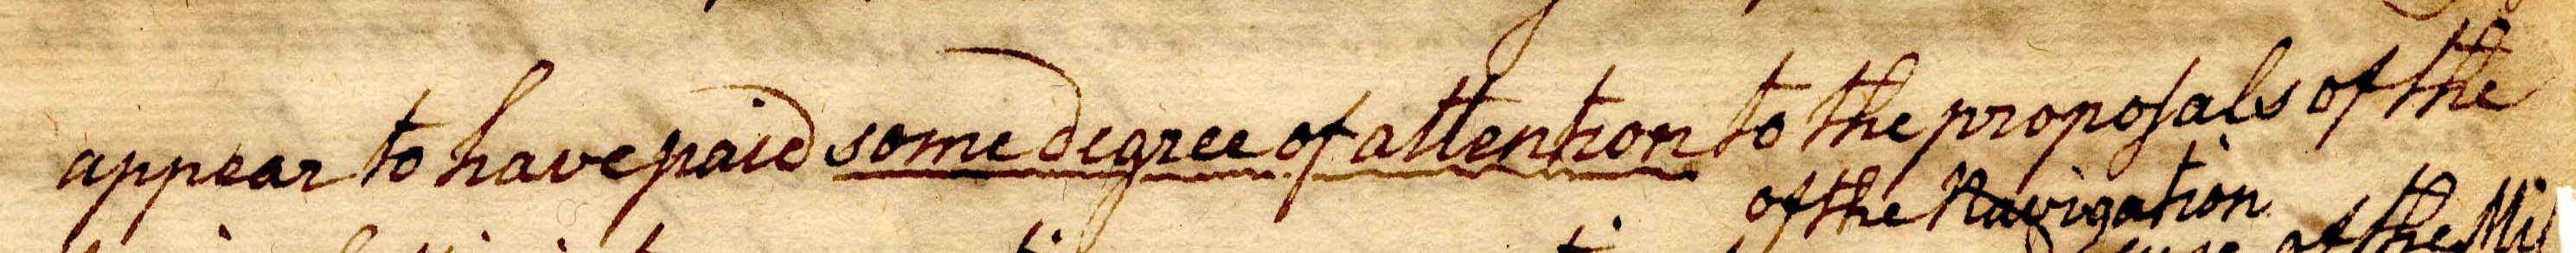appear to have paid some degree of attention to the proposals of the
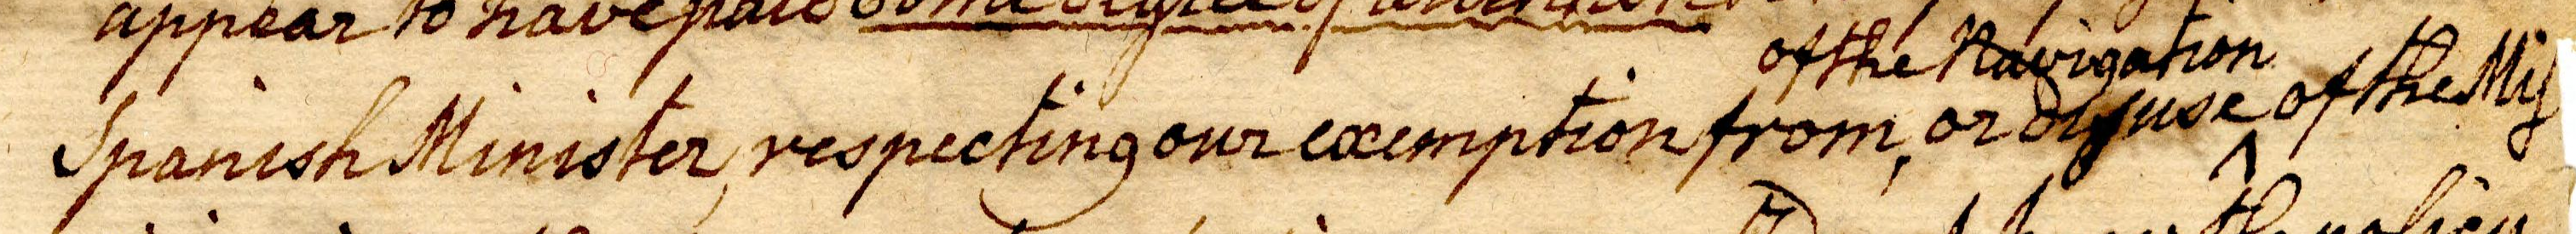Spanish Minister, respecting our exemption from, or disuse ^ of the Mis
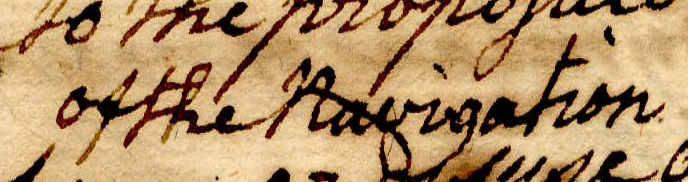of the Navigation
